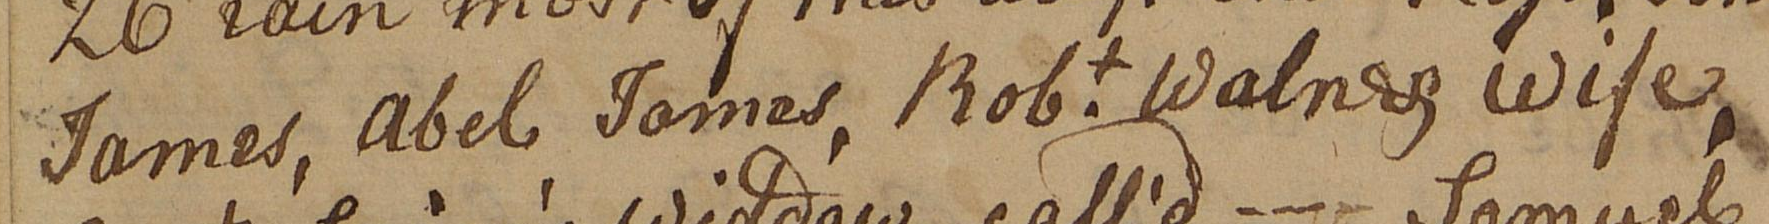James, Abel James, Rob^t. Waln & Wife,
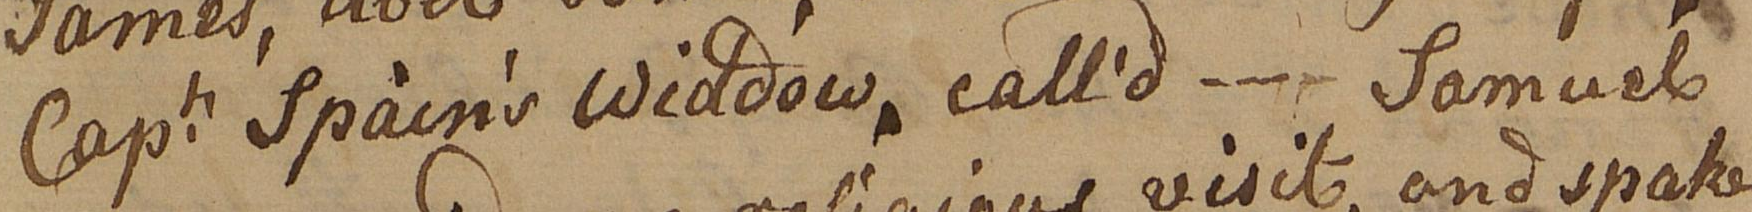Cap^t. Spain's Widdow, call'd- Samuel
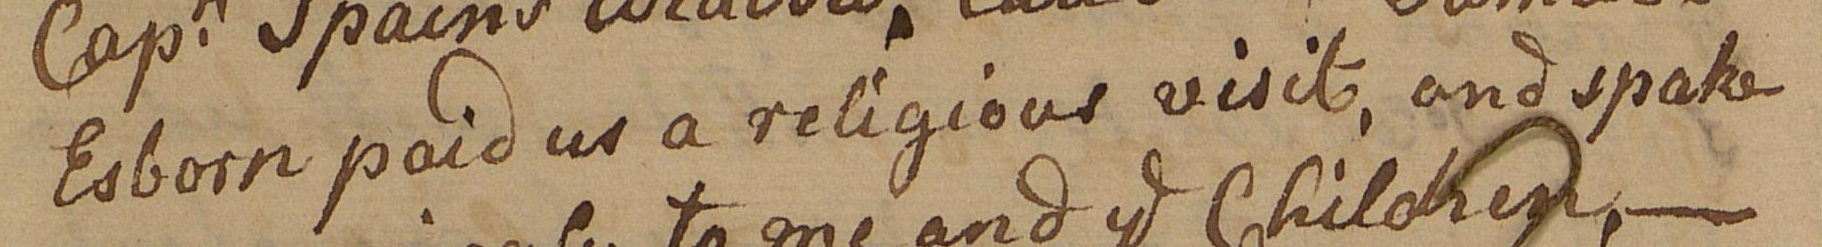Esborn paid us a religious visit, and spake
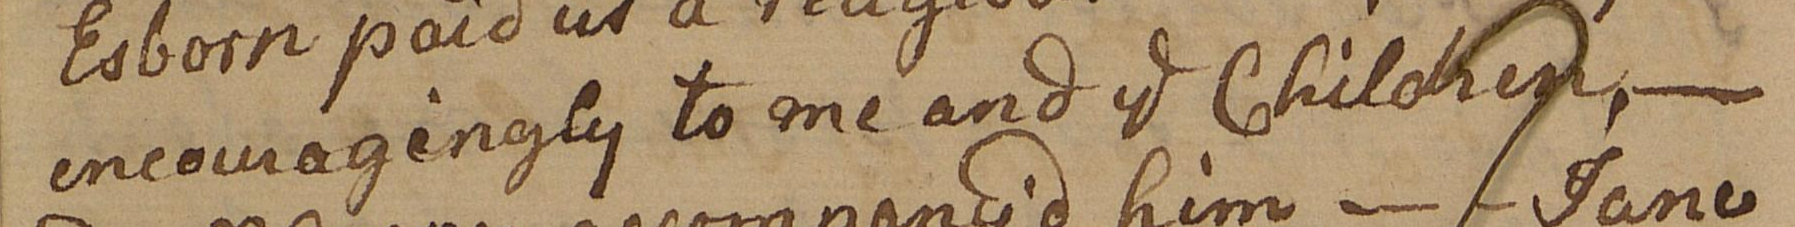encouragingly to me and y^e Children,-
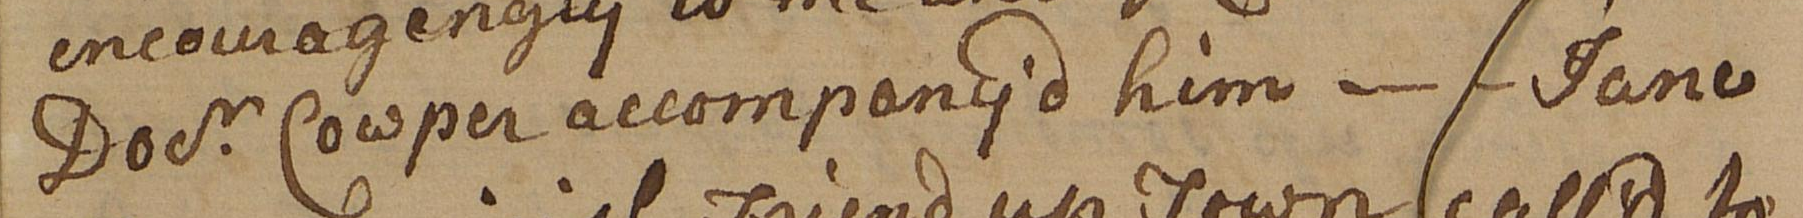Doc^r. Cowper accompany'd him-Jane
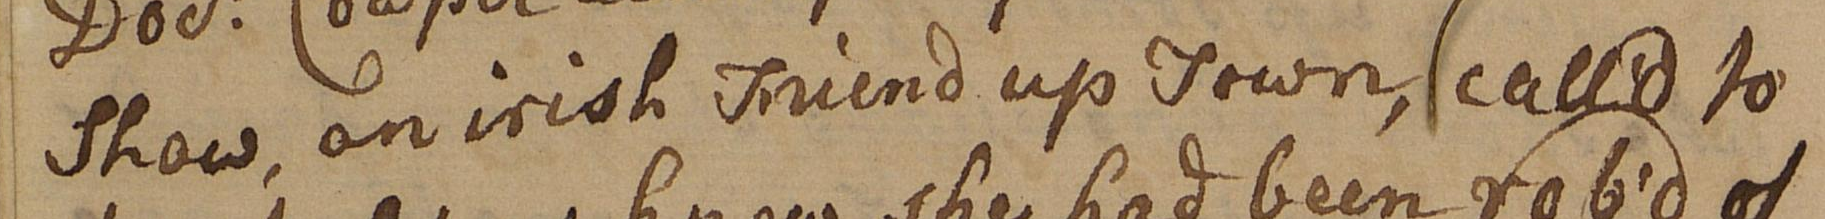Show, an irish Friend up Town, call'd to
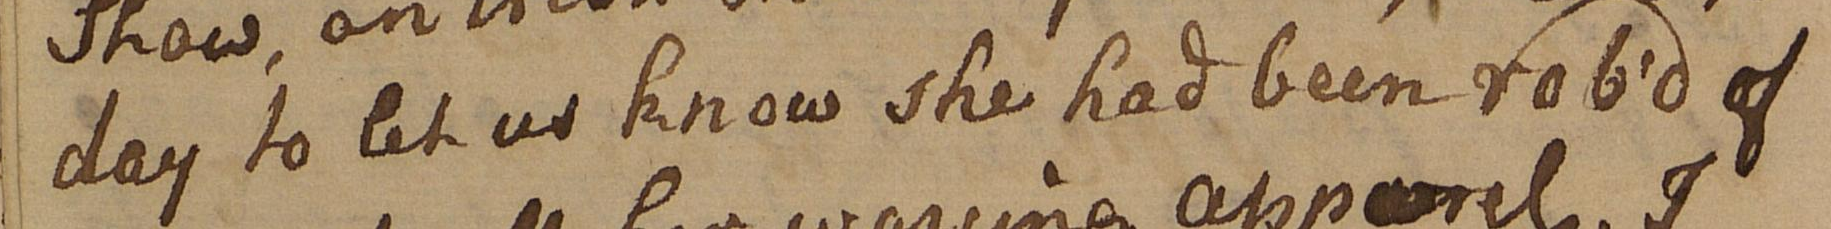day to let us know she had been rob'd of
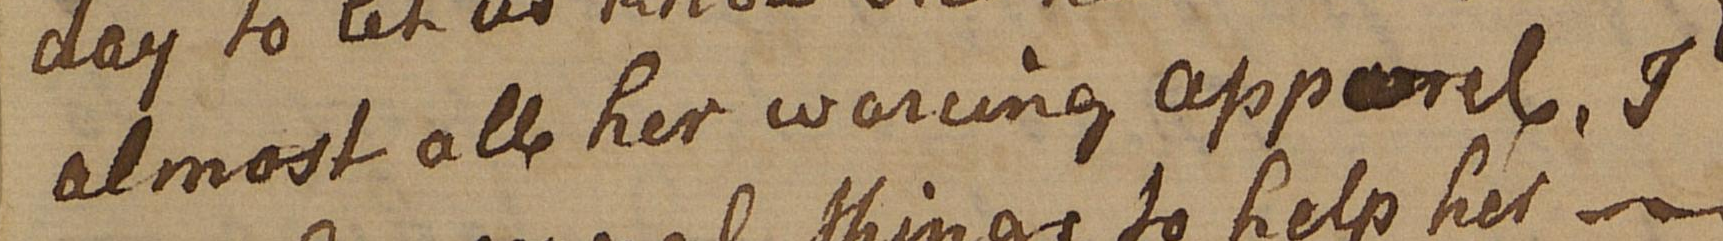almost all her wareing apparel, I
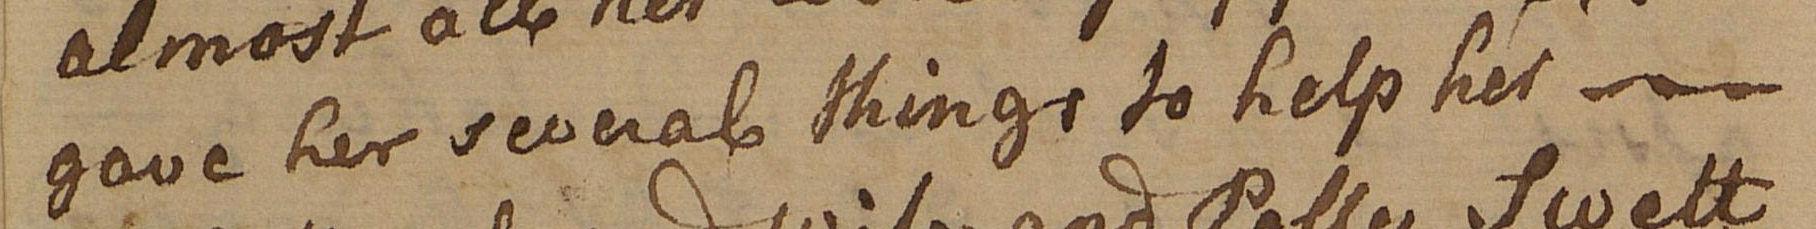gave her several things to help her-
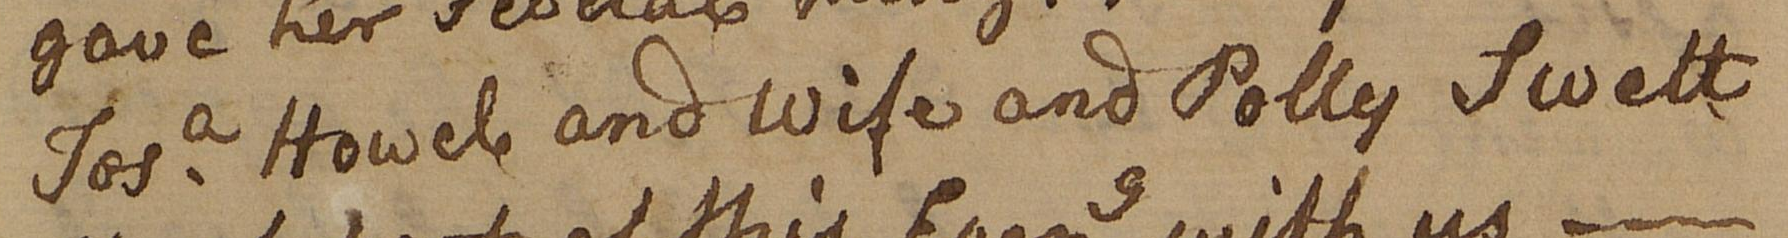Jos^a. Howel and wife and Polly Swett
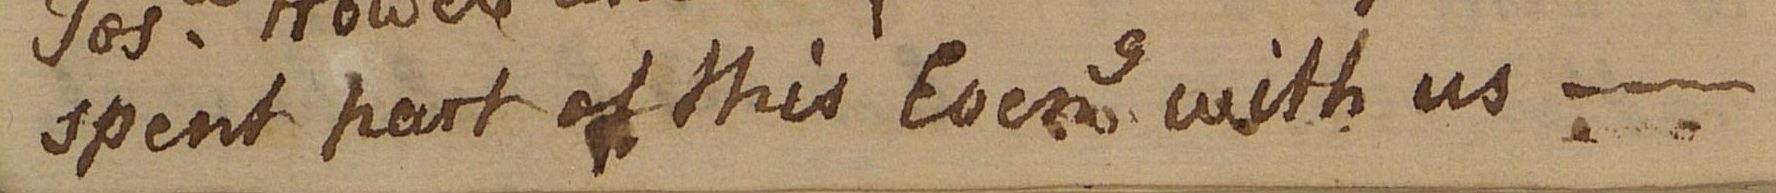spent part of this Even^g. with us-
